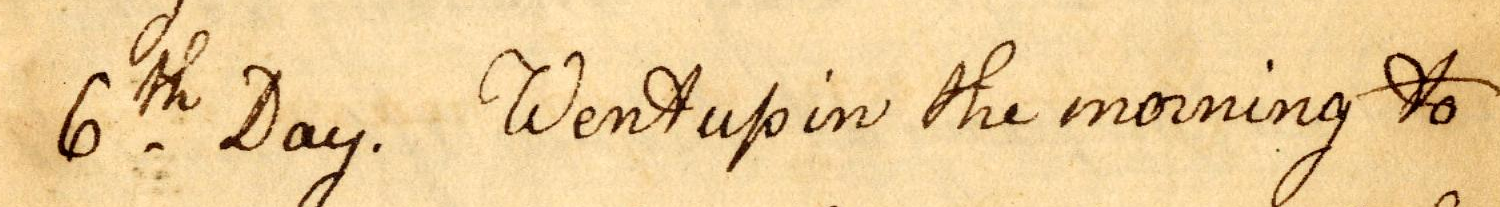6^th. Day. Went up in the morning to
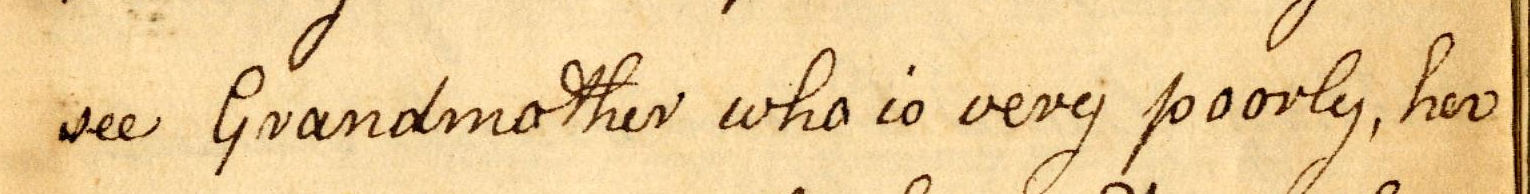see Grandmother who is very poorly, her
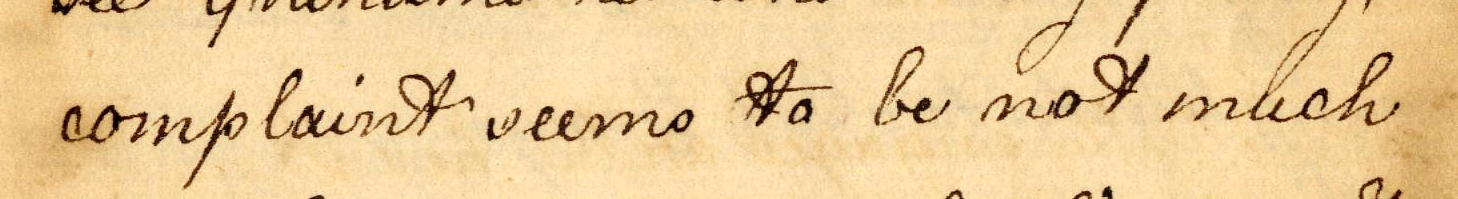complaint seems to be not much
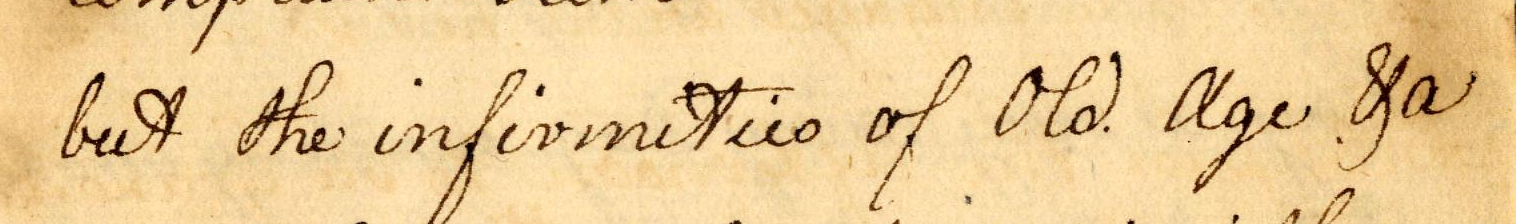but the infirmities of Old Age & a
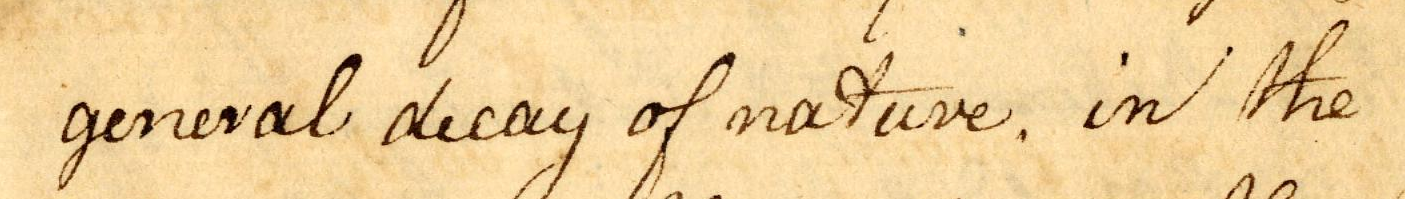general decay of nature. in the
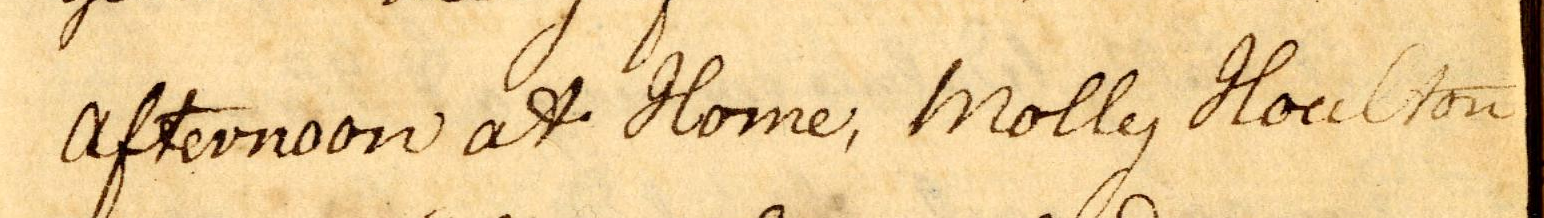Afternoon at Home, Molly Houlton
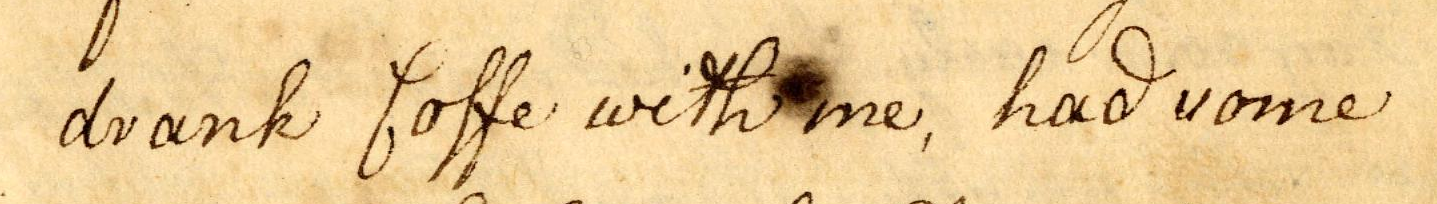drank Coffe with me, had some
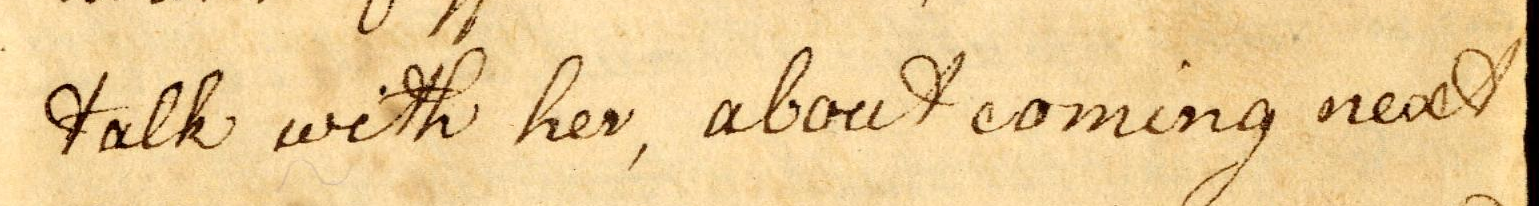talk with her, about coming next
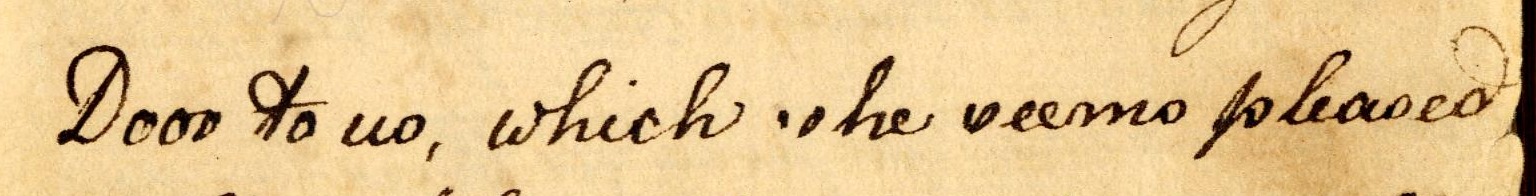Door to us, which she seems pleased
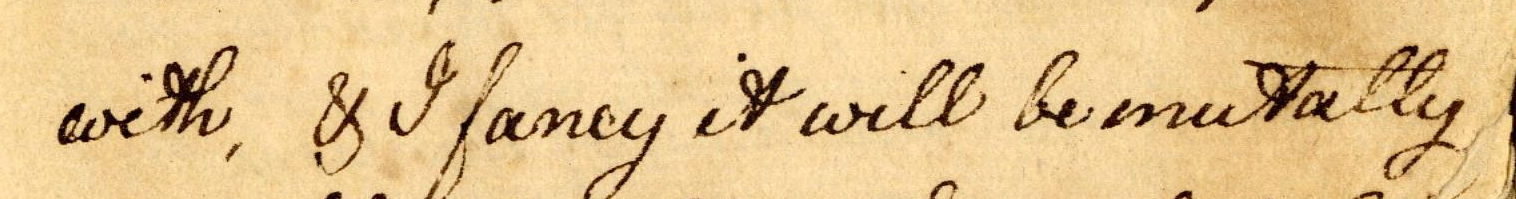with, & I fancy it will be mutally
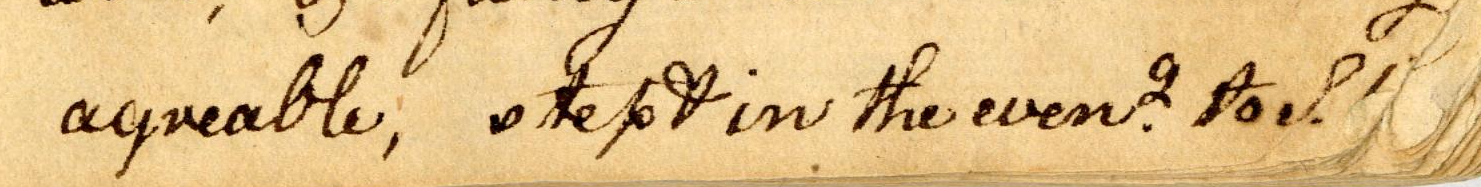agreable, stept in the even^g. to S. [_]
